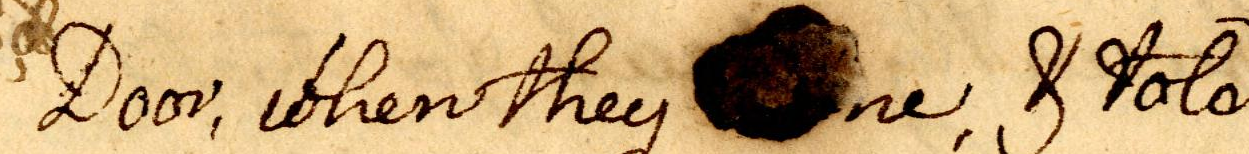Door, when they [__]ne, & told
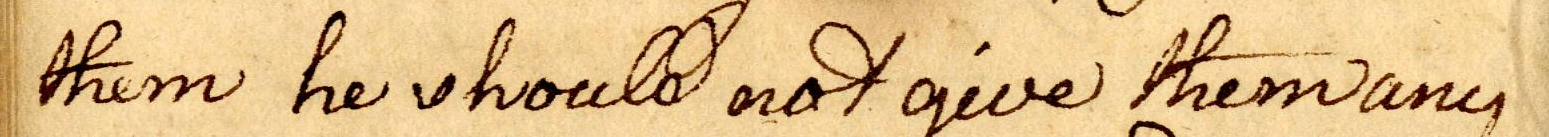them he should not give them any
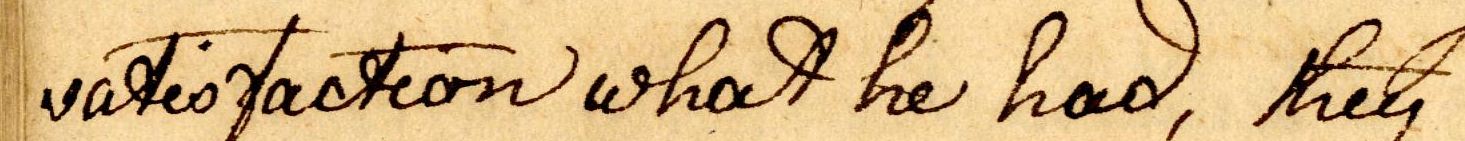satisfaction what he had, they
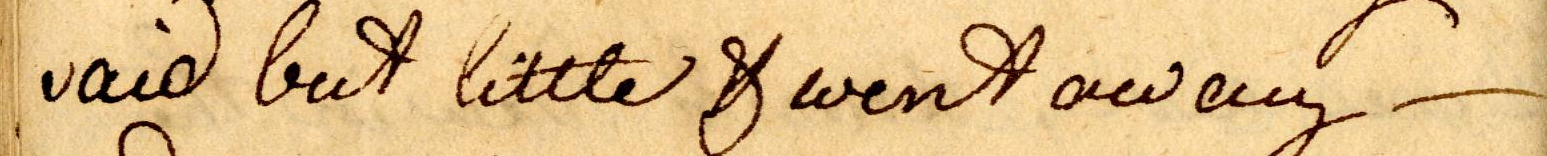said but little & went away-
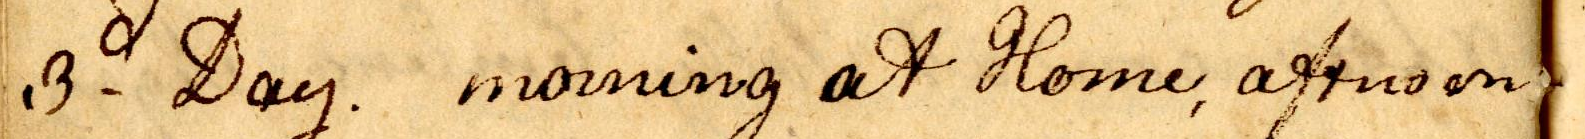3^d. Day. morning at Home, aftnoon
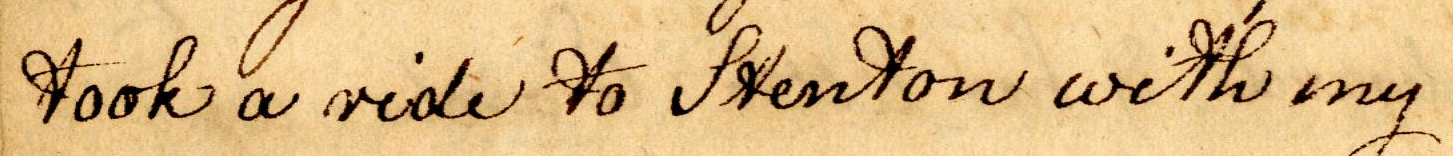took a ride to Stenton with my
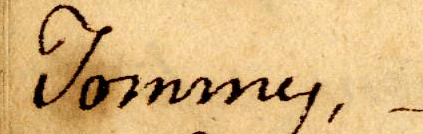Tommy,
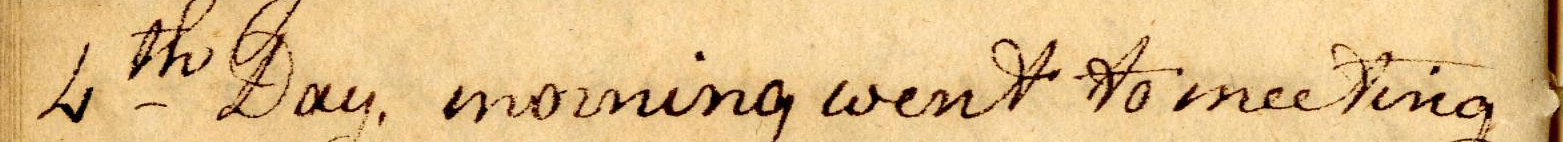4^th Day, morning went to meeting
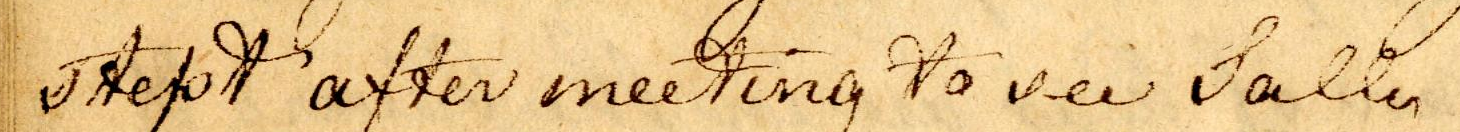stept after meeting to see Sally
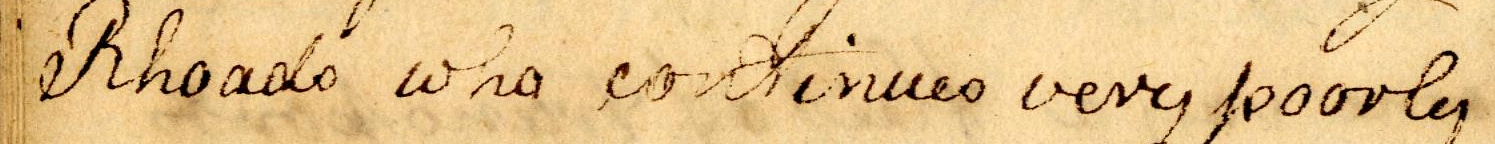Rhoads who continues very poorly
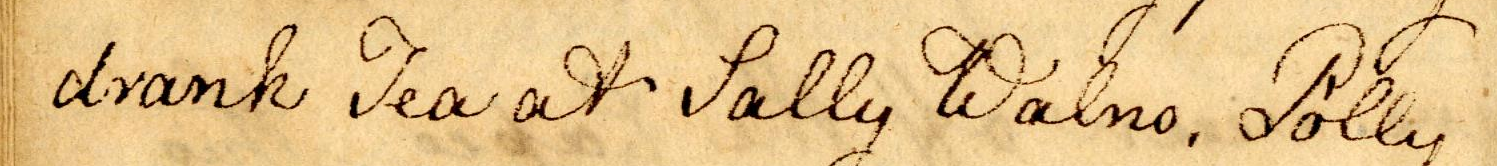drank Tea at Sally Walns, Polly
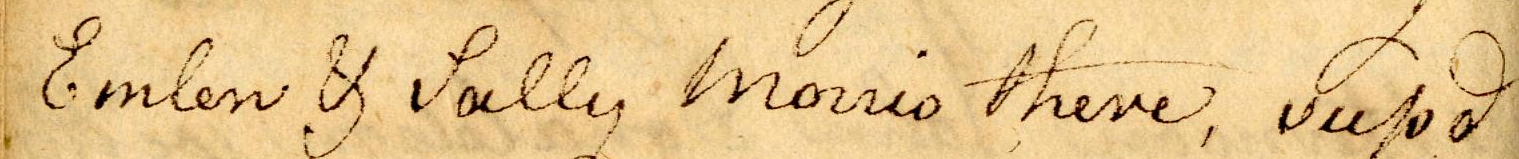Emlen & Sally Morris there, supd
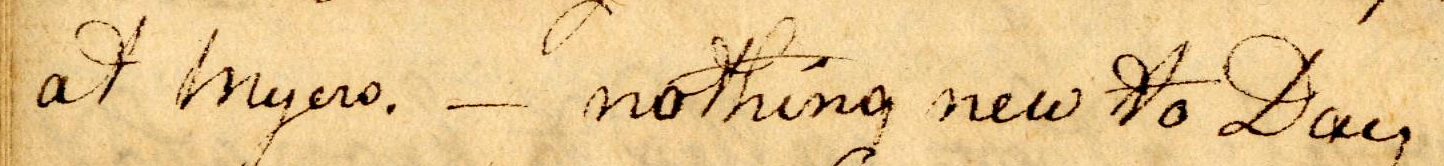at Myers.- nothing new to Day
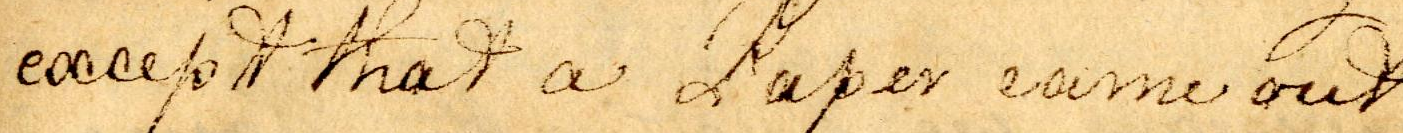except that a Paper came out
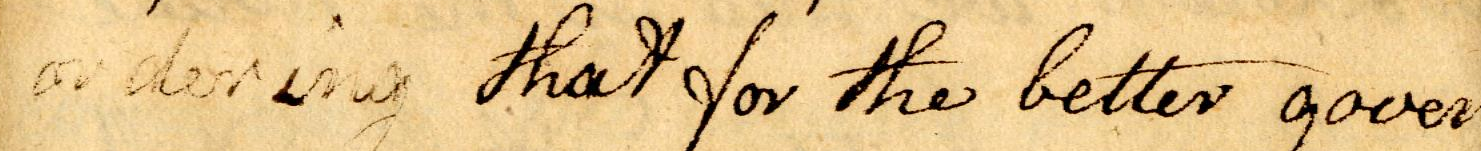ordering that for the better gover-
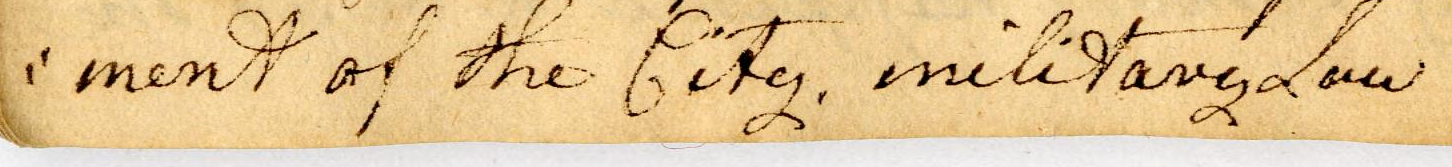-ment of the City, military Law
